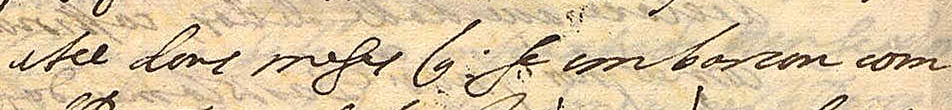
atee dous meses q̄ se embarcou com
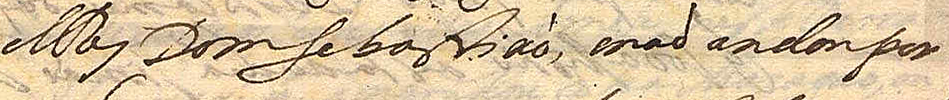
el Rej Dom sebastiaõ, e naõ andou por
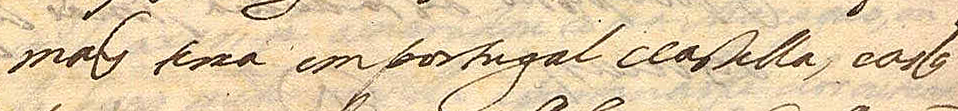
mais terra em portugal e castella, e as q̄
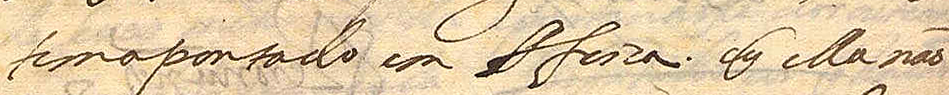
tem apontado em Africa. e q̄ ella naõ
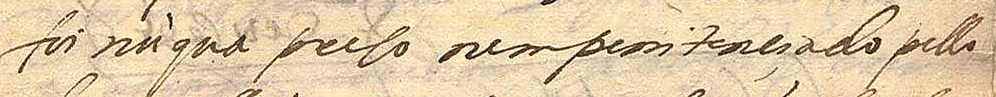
foi nūqua preso nem penitenciado pello
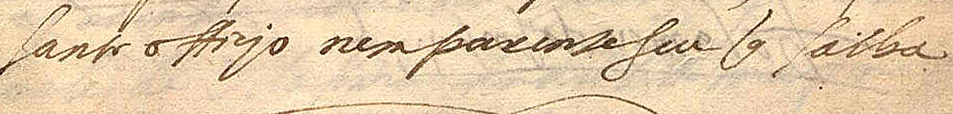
santo officjo nem parente seu q̄ saiba
